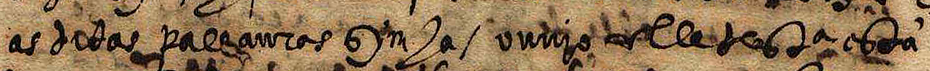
as ditas pallauras sym Ja / ouujo elle testa estā
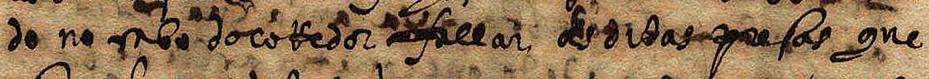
do no cabo do coRedor fallar as ditas presas que
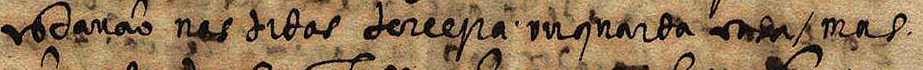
estauaõ nas ditas tercejra ou quarta casa / mas
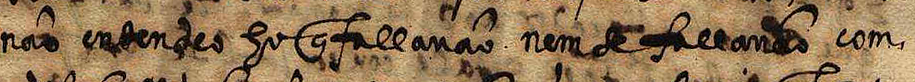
naõ entendeo ho q̄ fallauaõ nem se fallauaõ com
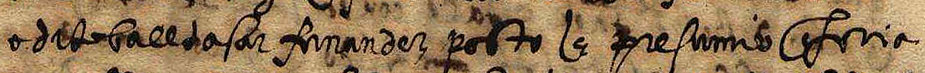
o dito balltasar fernandez posto q̄ presumio q̄ seria
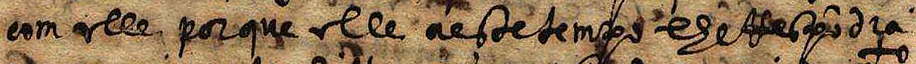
com elle porque elle a este tempo lhe Respōdia
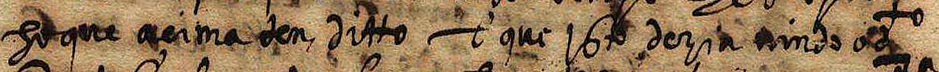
ho que acima tem ditto E que jsto dezia uindo o dto
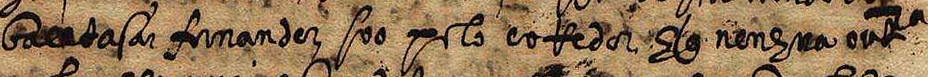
balltasar fernandez soo polo coRedor E q̄ nenhua outra
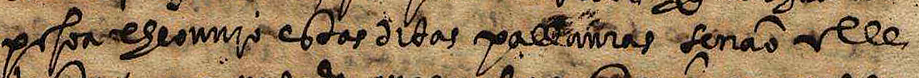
pesoa lhe ouujo estas ditas pallauras senaõ elle
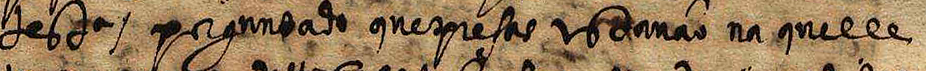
testa / perguntado que presas estauaõ naquelle
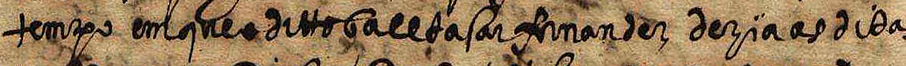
tempo em que o ditto balltasar fernandez dezia as ditas
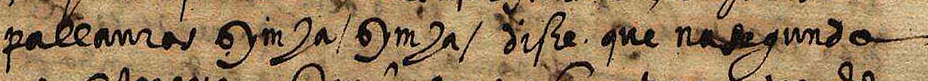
pallauras sym Ja / sym Ja / disse que na segunda
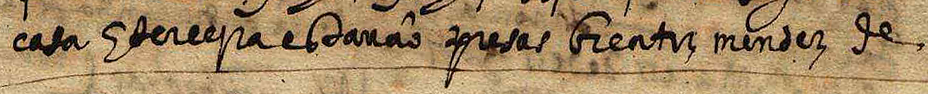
casa E tercejra estauaõ presas breatiz mendez de
